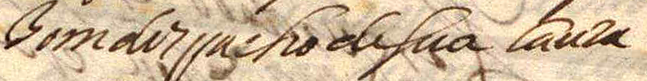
bom despacho de sua cauza
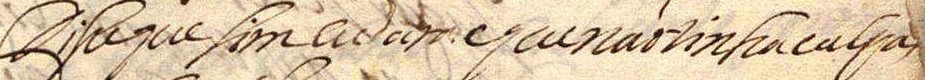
Disse que sim cudara e que naõ tinha culpas
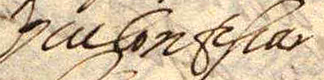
que Confessar
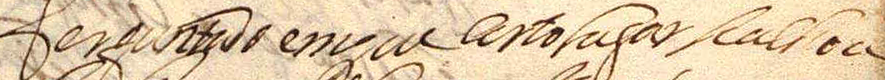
Perguntado em que certo Lugar se achou
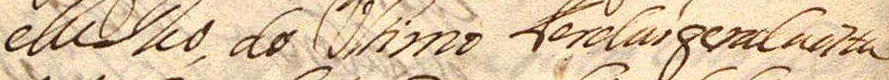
elle Reo, do Vltimo Perdaõ geral a esta
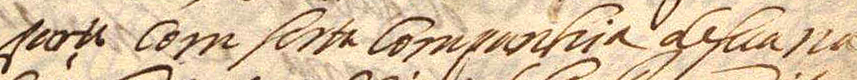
parte Com serta Companhia de sua na
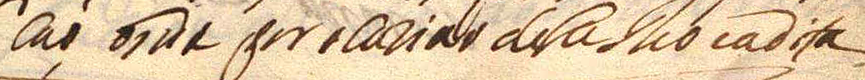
çaõ onde por ocaziao delle Reo e a dita
